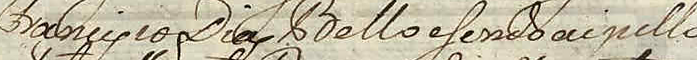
Francisco Dias Bello e sendo ai pello
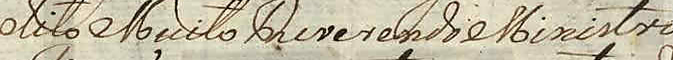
dito Muito Reverendo Ministro
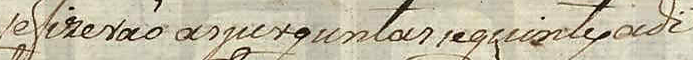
se fizeraõ as perguntas seguintes a di
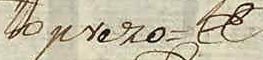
do prezo=Etc
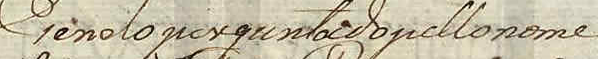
E sendo perguntado pello nome
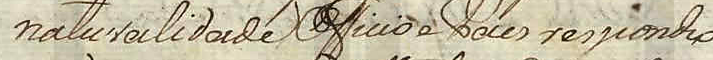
naturalidade Officio e Paes respondeo
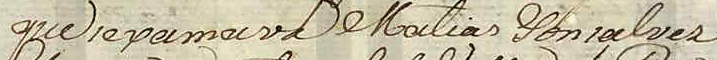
que se xamava Matias Gonsalvez
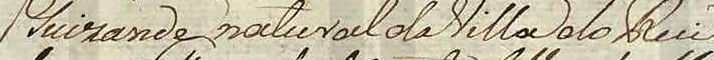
Guizande natural da Villa do Reci
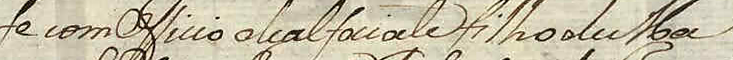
fe com Officio de alfaiate filho de Ma
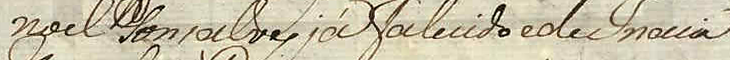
noel Gonsalves já falecido e de Inacia
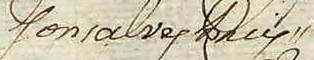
Gonsalves Reis//
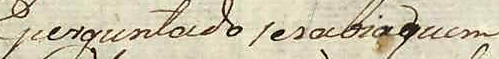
E perguntado se sabia quem
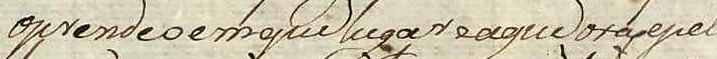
o prendeo em que lugar e a que oras e pel
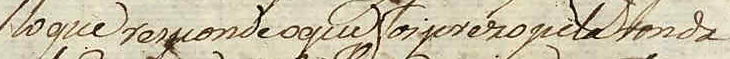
lo que responde o que foi prezo pela Ronda
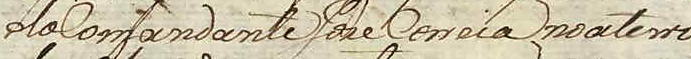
do Comandante Joze Correia no aterro
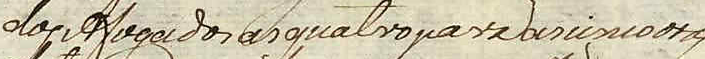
dos Afogados as quatro para as sinco oras
